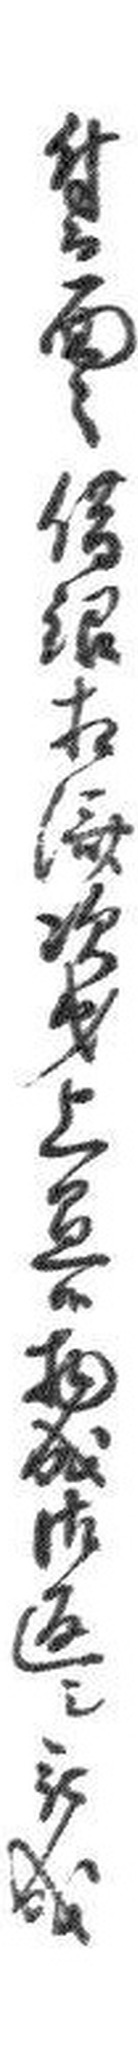付而面々借銀相済次第上置候物成御返シ被成
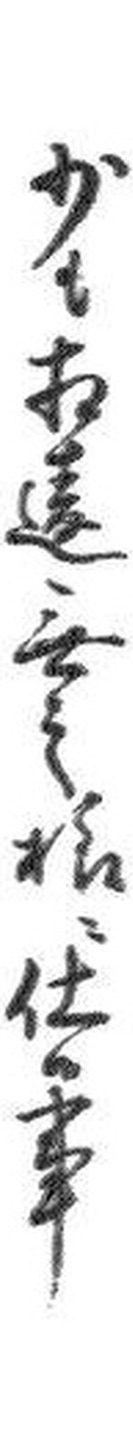少も相違無之様ニ仕候事
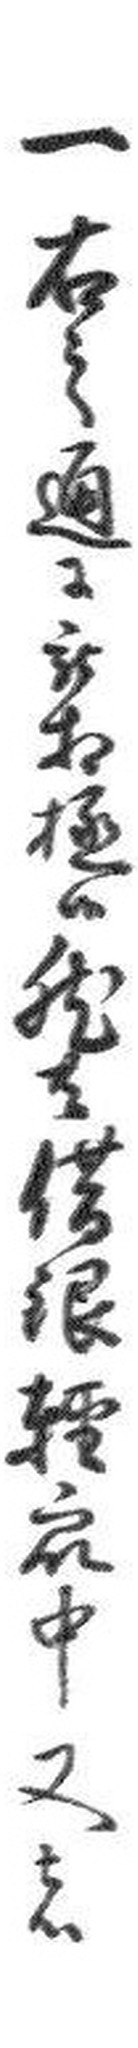一右之通に被相極候然共借銀軽衆中又者
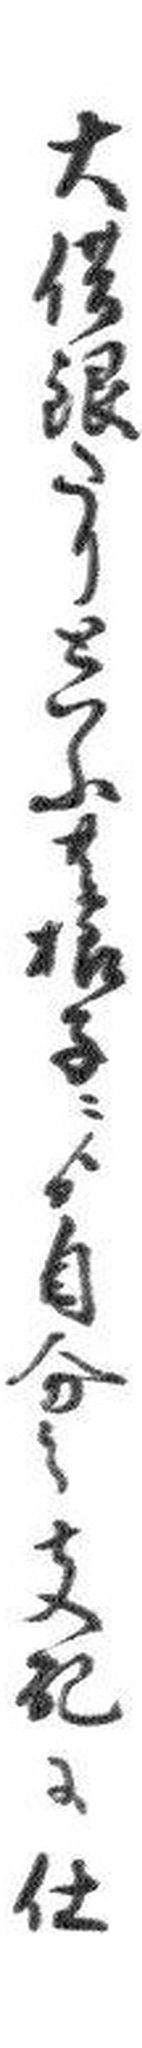大借銀たりといふ共様子ニゟ自分之支配に仕
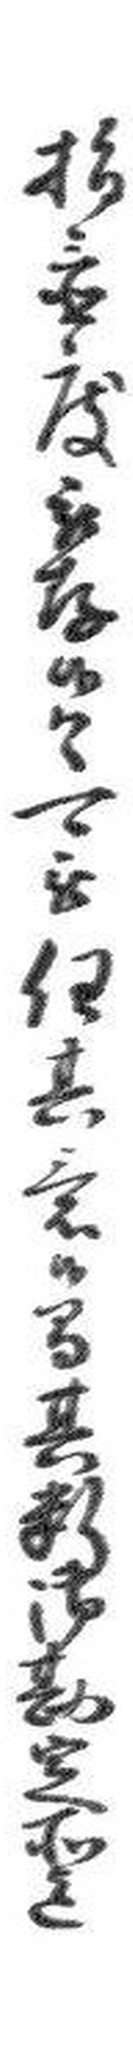指置度被存候はゝ可被任其意候間其断御勘定所迄
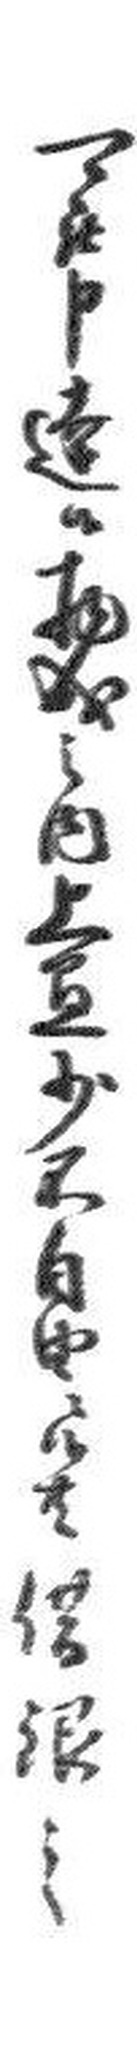可被申達候物成之内上置少不自由ニ候共借銀之
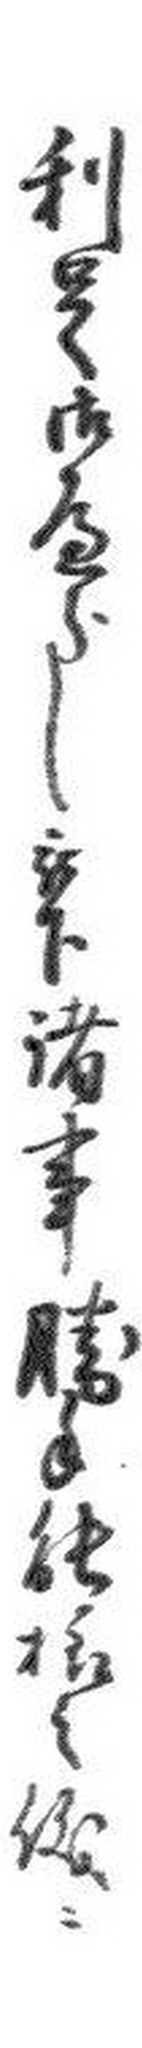利足御へらし被下諸事勝手能様之儀ニ
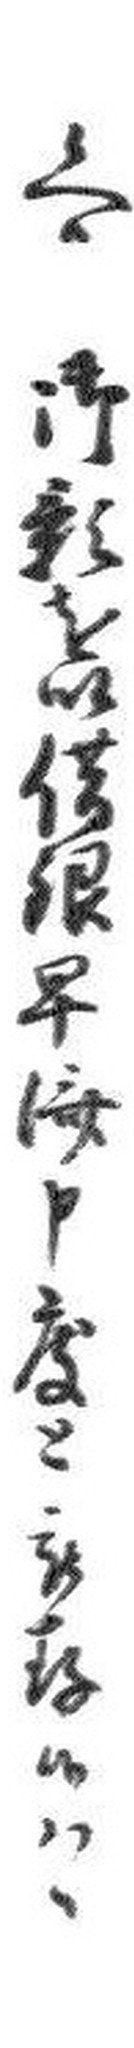候へは御影を以借銀早済申度と被存候ハゝ
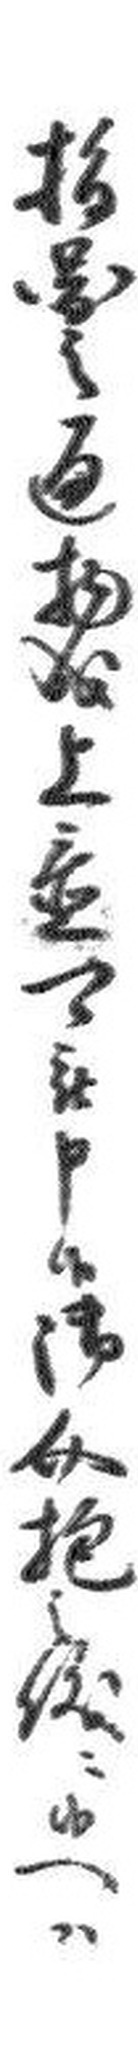指図之通物成上置可被申候御介抱之儀ニ候へは

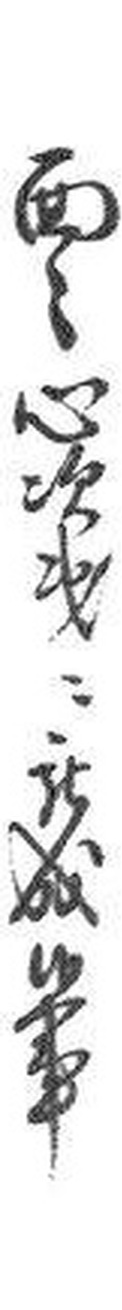面々心次第ニ被成候事
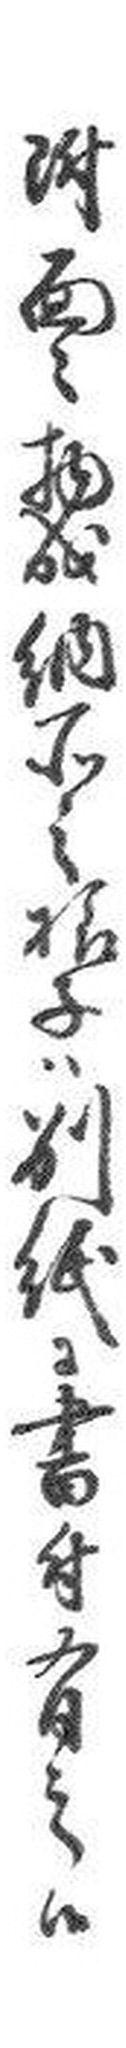附面々物成納所之様子は別紙に書付有之候
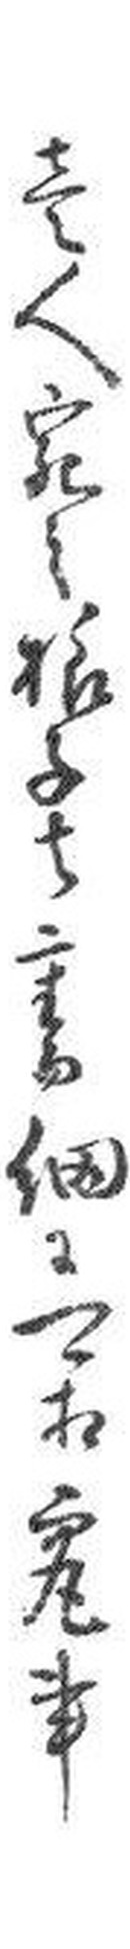壱人宛之様子者重而細に可相究事
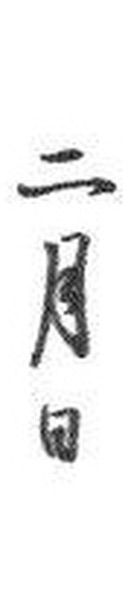二月日
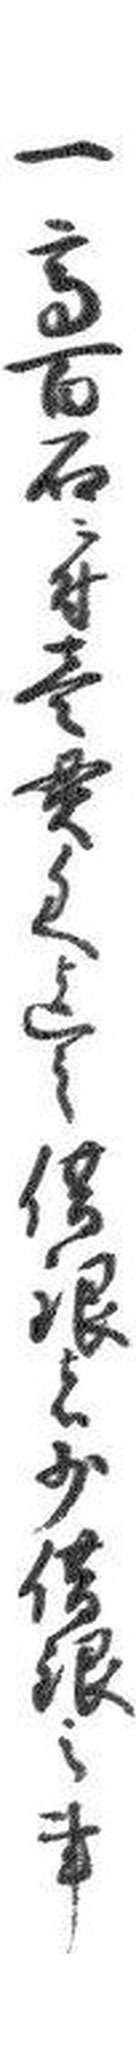一高百石ニ付壱貫匁迄之借銀者少借銀之事
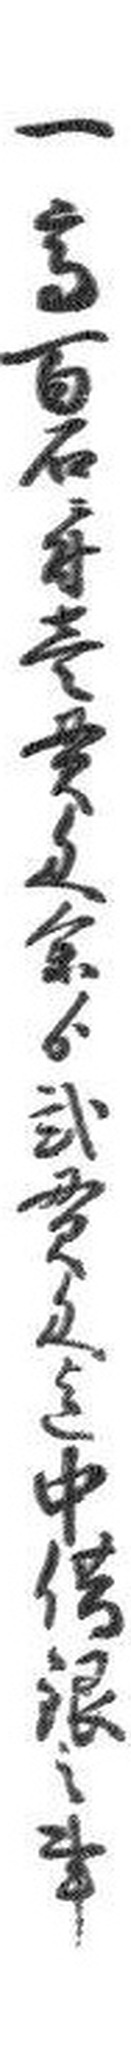一高百石ニ付壱貫匁余ゟ弐貫匁迄中借銀之事
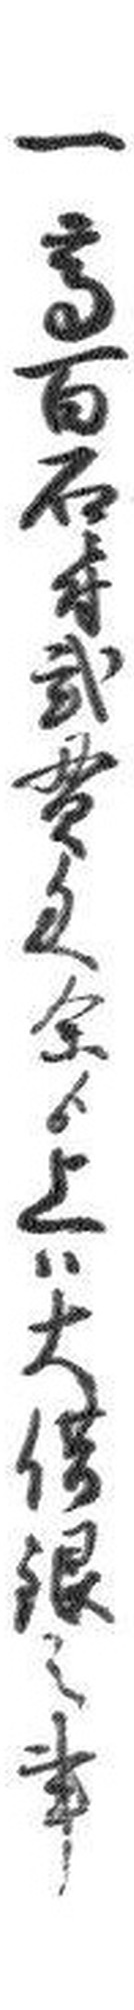一高百石ニ付弐貫匁余ゟ上は大借銀之事
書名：家譜 八 光通公 従寛文十年到同十二年
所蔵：福井県文書館 Fukui Prefectural Archives
